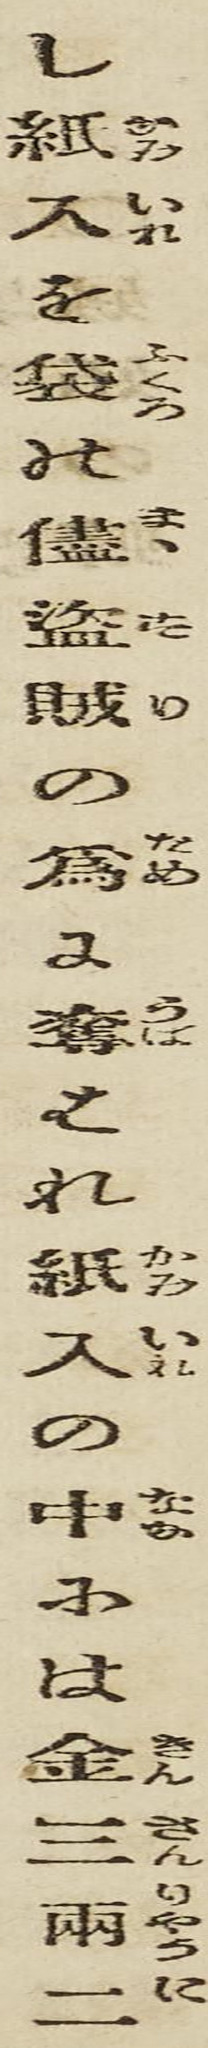し紙入を袋の侭盗賊の為に奪はれ紙入の中には金三両二
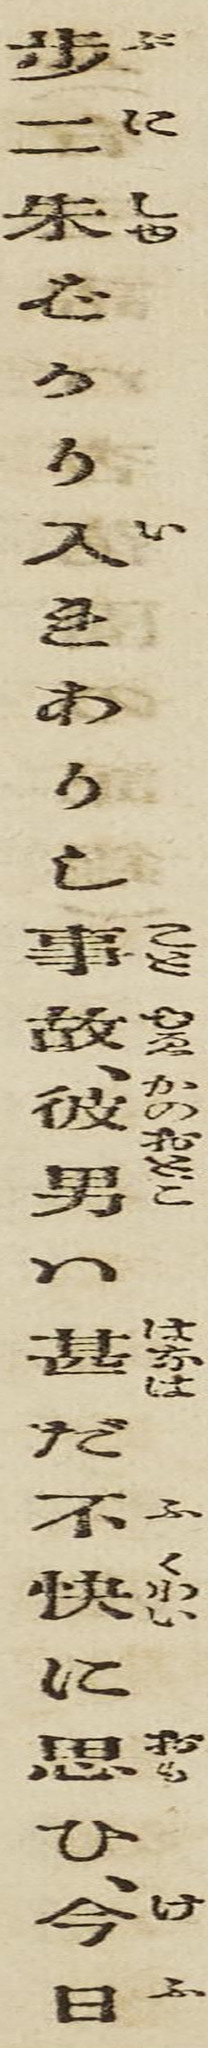歩二朱ばかり入れありし事故、彼男は甚だ不快に思ひ、今日
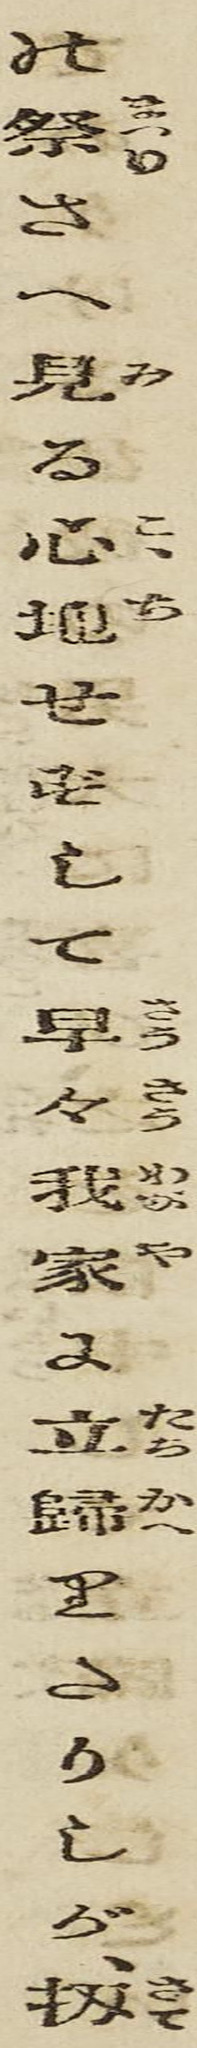の祭さへ見る心地せずして早々我家に立帰りたりしが、扨
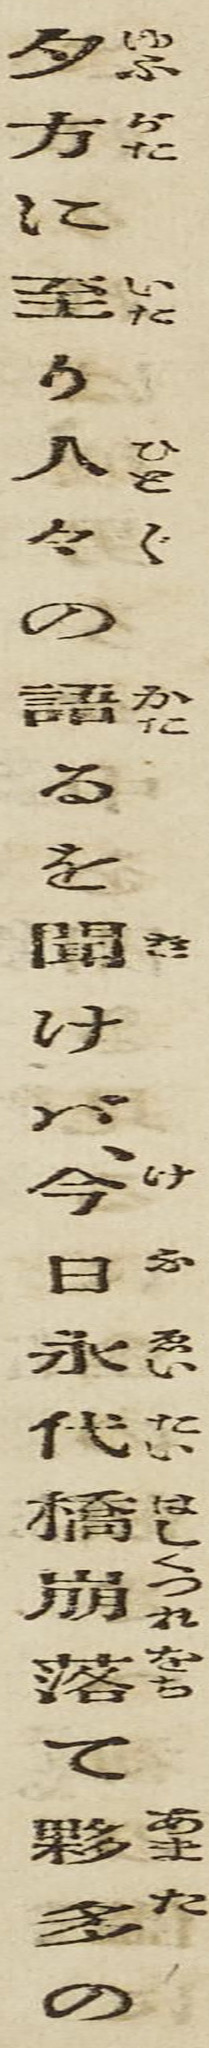夕方に至り人々の語るを聞けば、今日永代橋崩落て夥多の
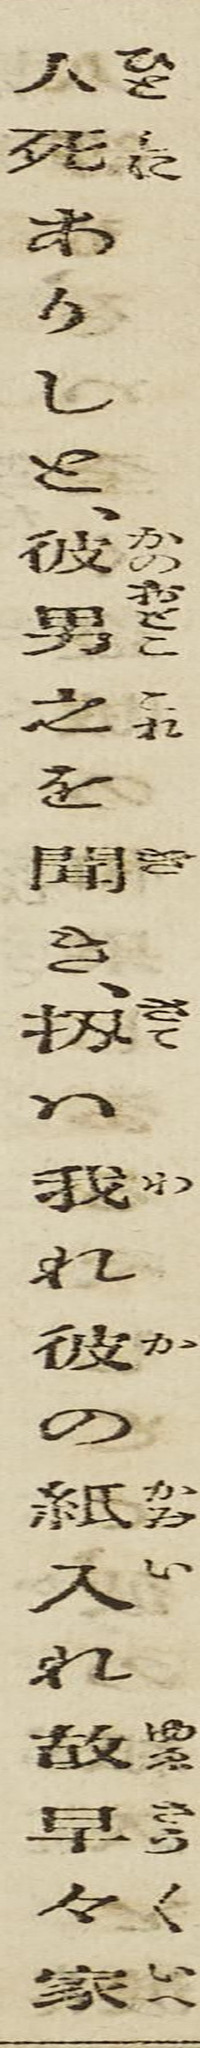人死ありしと、彼男之を聞き、扨は我れ彼の紙入れ故早々家
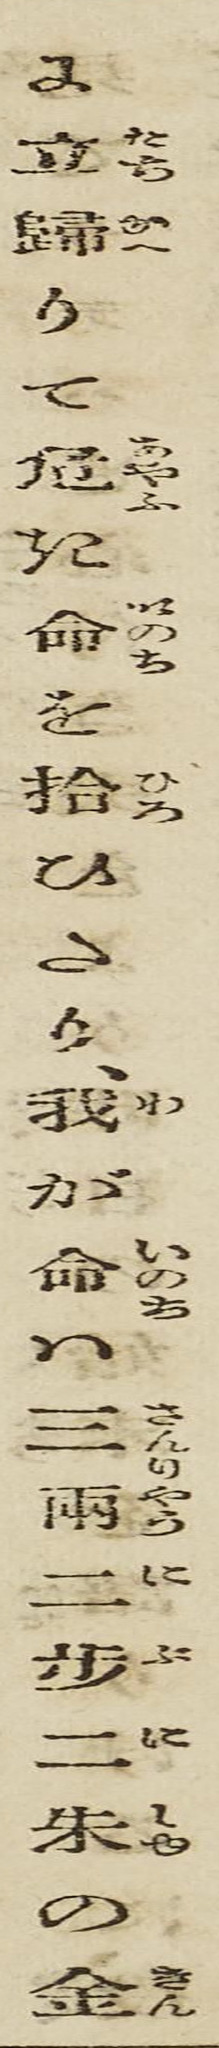に立帰りて危き命を拾ひたり、我が命は三両二歩二朱の金
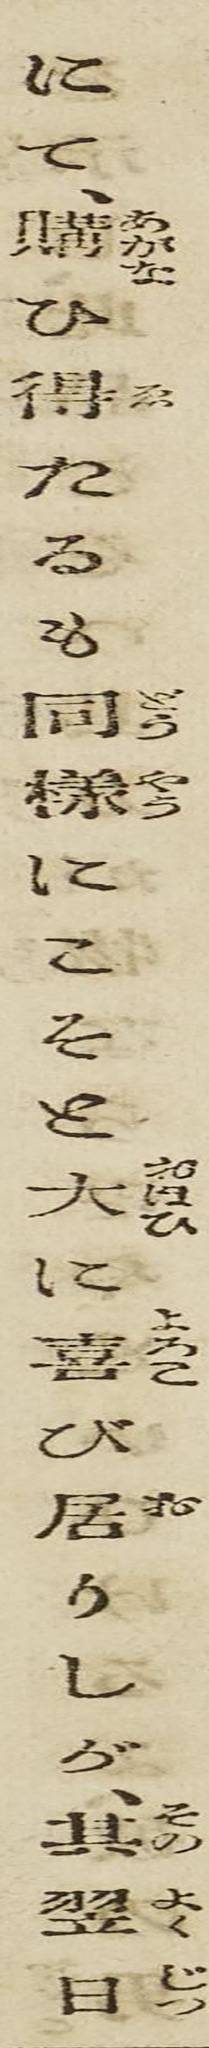にて、購ひ得たるも同様にこそと大に喜び居りしが、其翌日
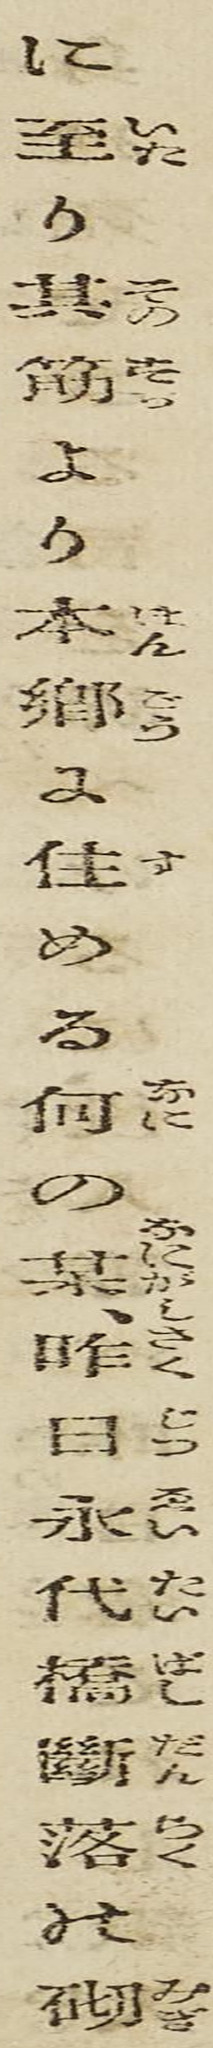に至り其筋より本郷に住める何の某、昨日永代橋断落の砌
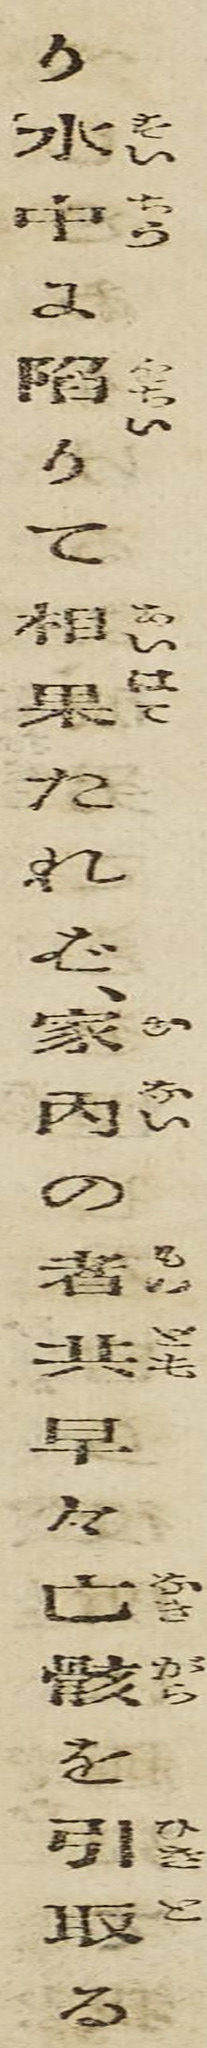り水中に陥りて相果たれば、家内の者共早々亡骸を引取る

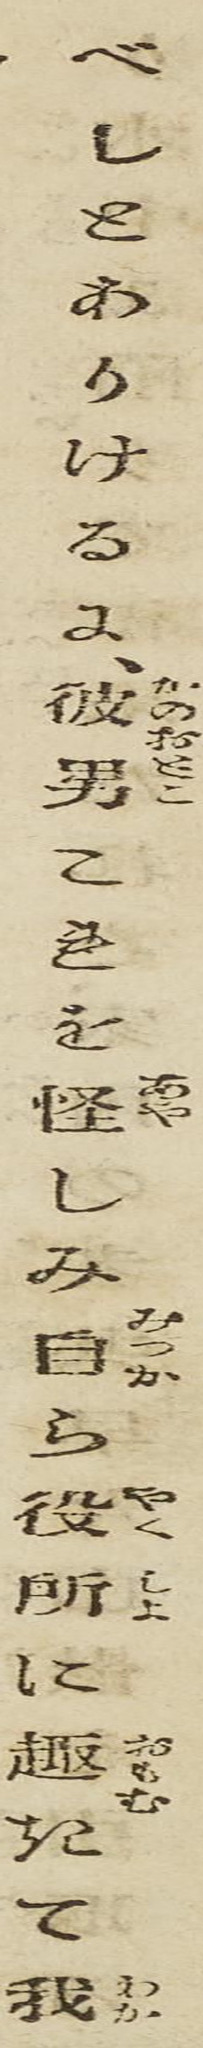べしとありけるに、彼男これを怪しみ自ら役所に趣きて我
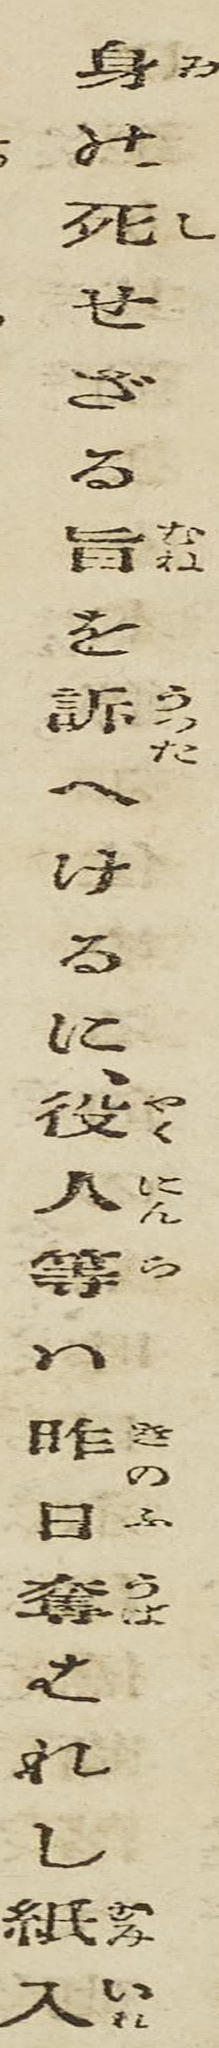身の死せざる旨を訴へけるに、役人等は昨日奪はれし紙入
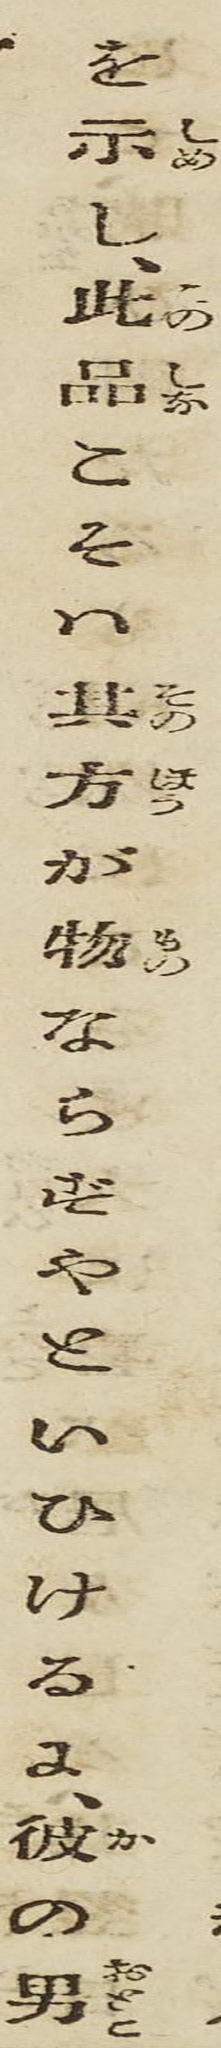を示し、此品こそは其方が物ならずやといひけるに、彼の男
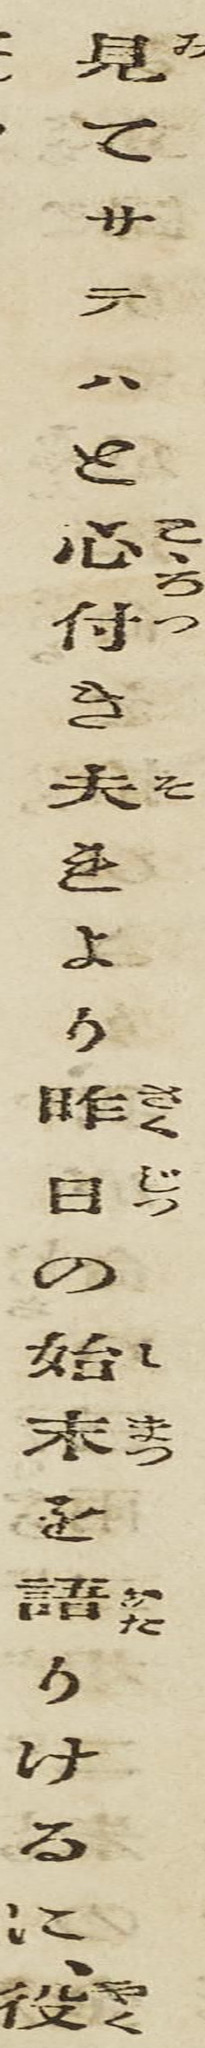見てサテハと心付き夫れより昨日の始末を語りけるに、役
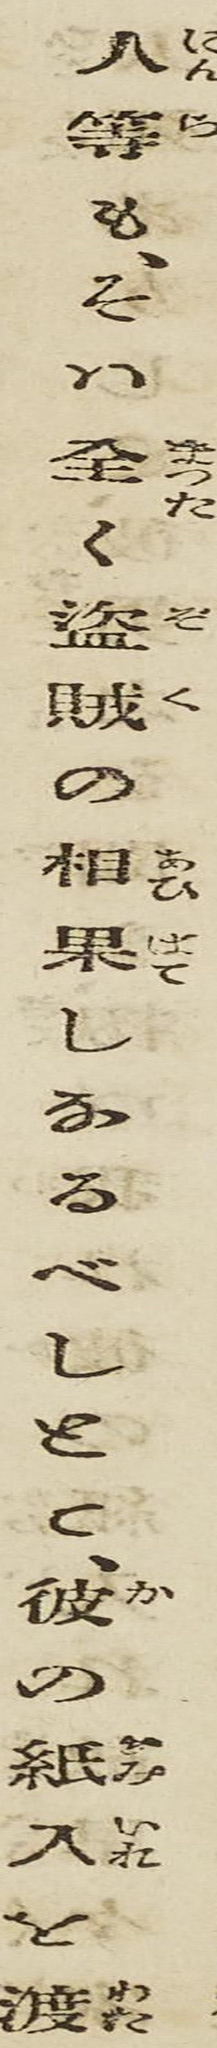人等も、そは全く盗賊の相果しなるべしとて、彼の紙入を渡
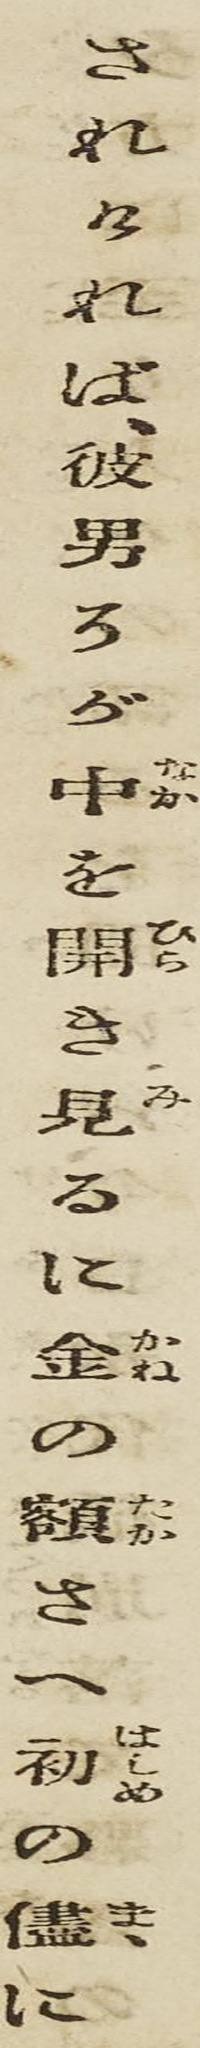されければ、彼男そが中を開き見るに金の額さへ初の侭に
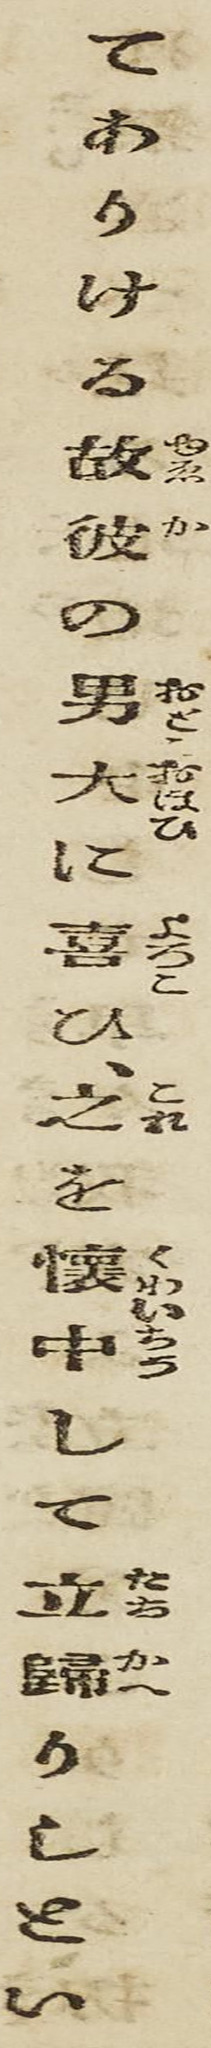てありける故彼の男大に喜ひ、之を懐中して立帰りしとい
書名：永代惨話　文化の夢　全
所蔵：東京大学地震研究所図書室 Earthquake Research Institute Library, The University of Tokyo, JAPAN
